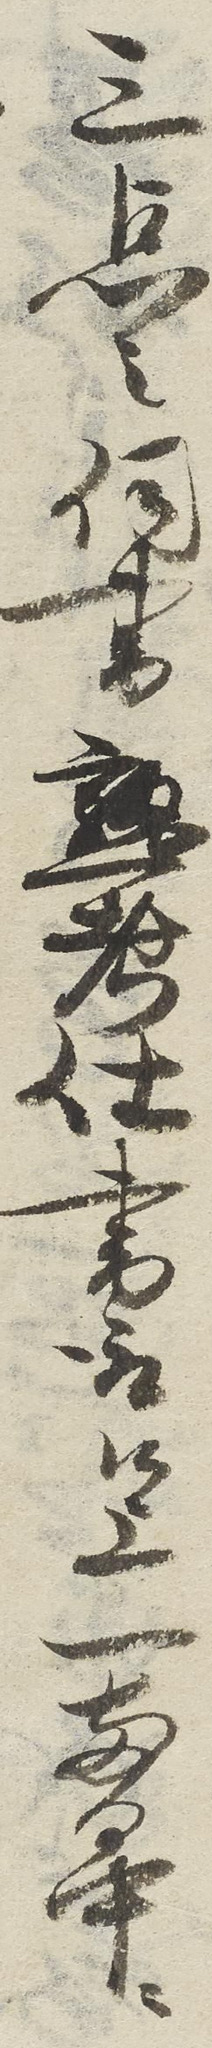三点之伺書熟考仕書取候上一両日中二
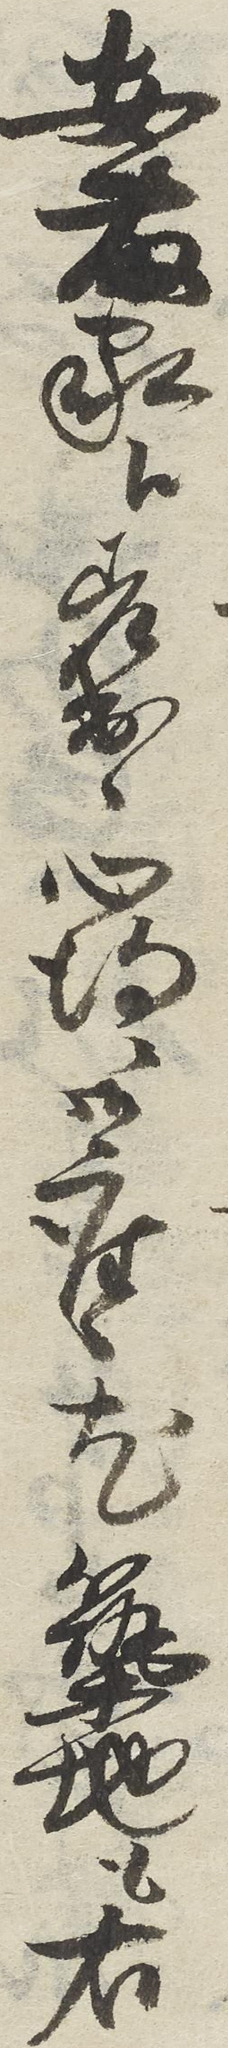安藤家江差出候心得二御座候尤築地も右
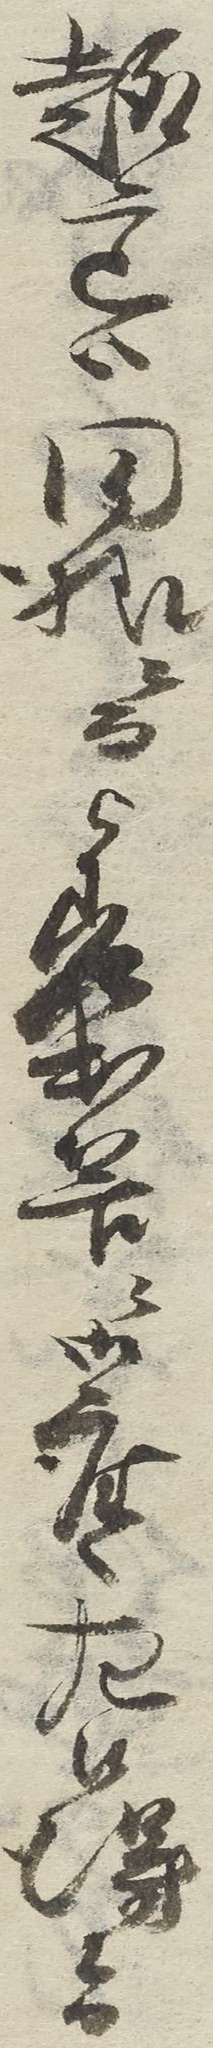趣意は同様二而被差出筈二御座候左候得は
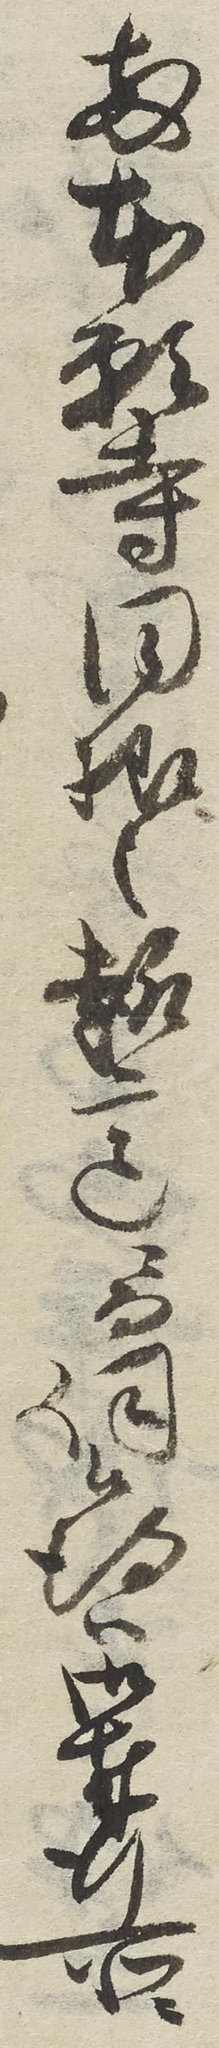両本願寺同様之趣意二而伺候得ハ御奉行所二
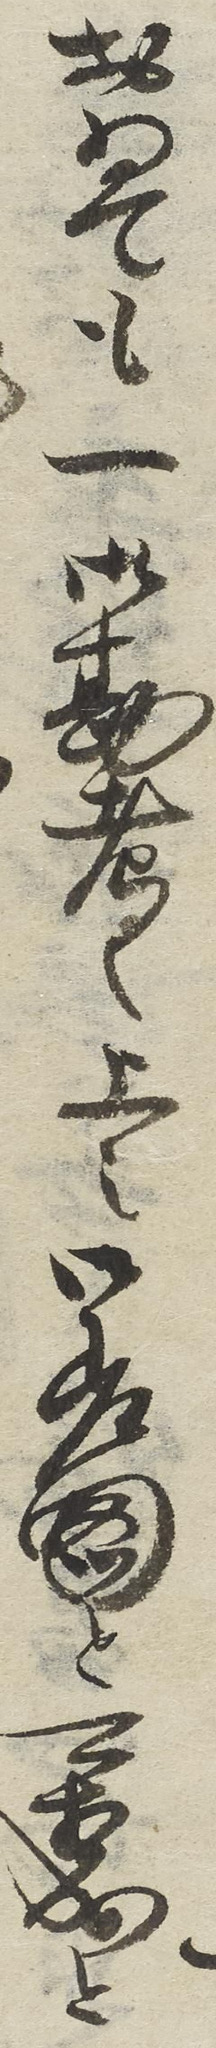おゐても一御勘考之上之御差図と可相成と
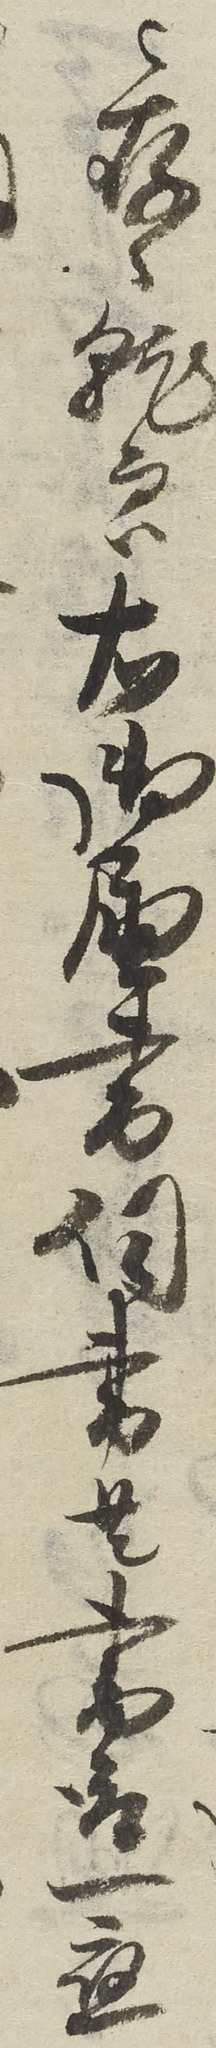被存候就而ハ右御届書伺書共書取一応
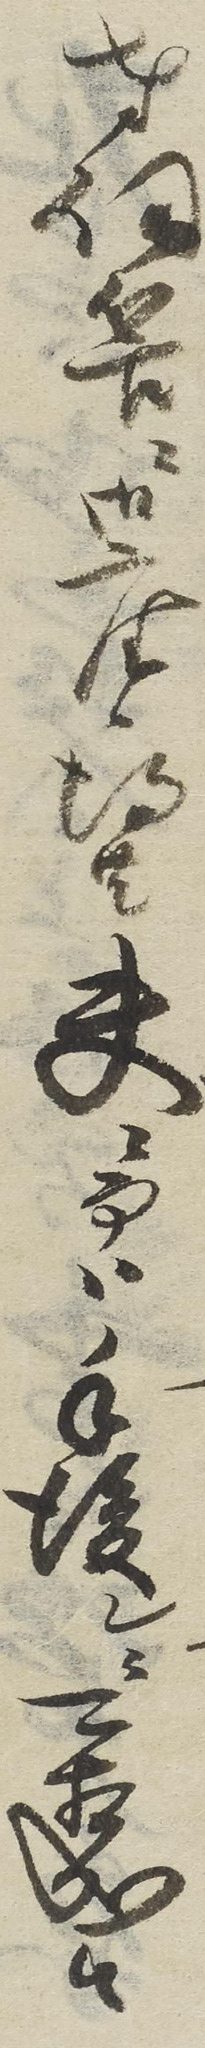奉伺筈二御座候得共夫二而ハ手後レ二可相成候

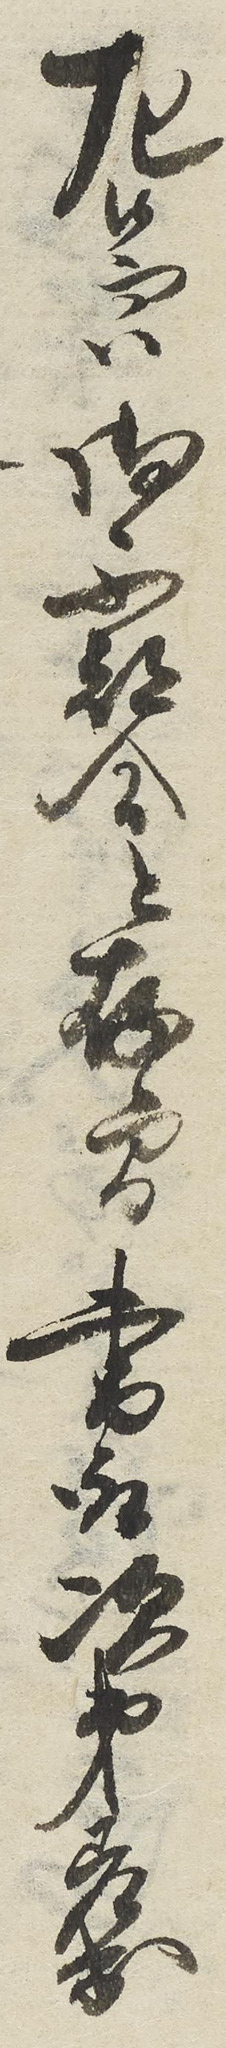左候而ハ御不都合と存候間書取次第差出
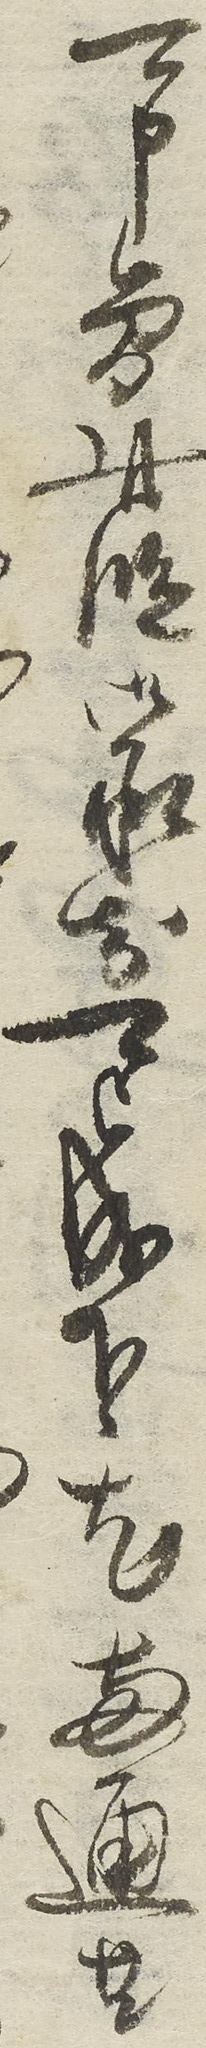可申候間此段御承知可被成下候尤両通共
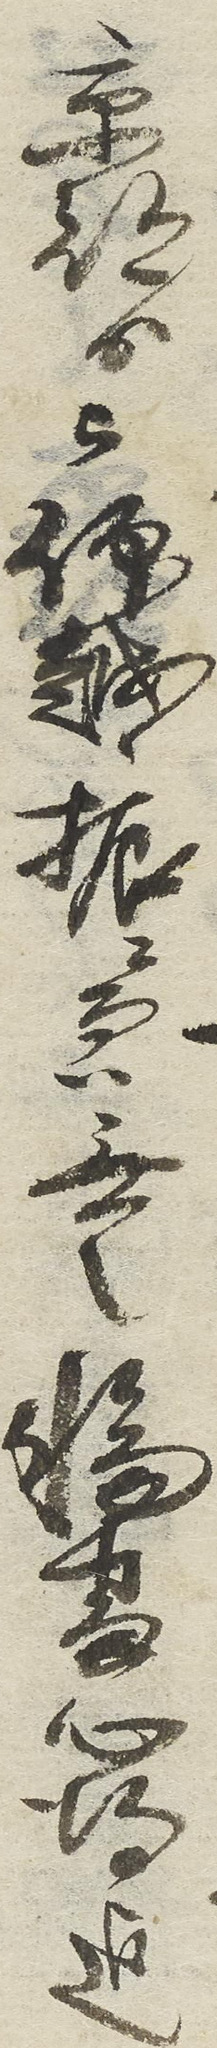京都ゟ被仰越候振二而は無之輪番心得迄
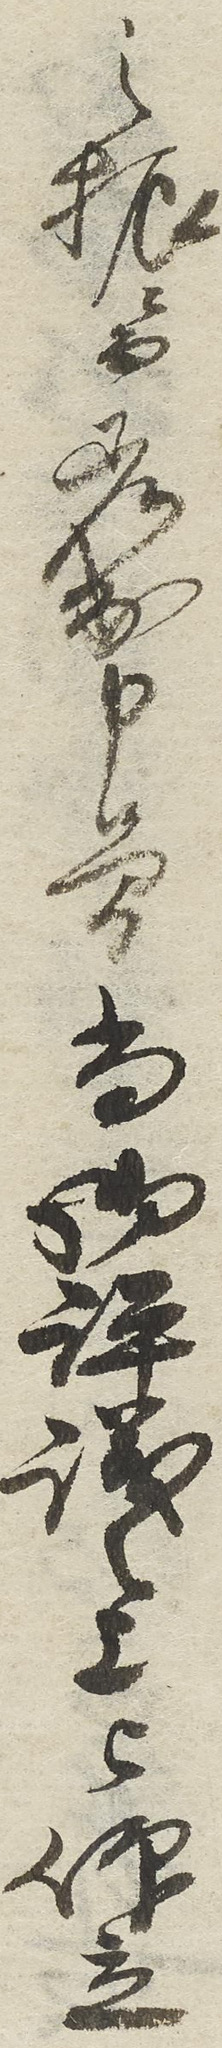之振二而差出申候間尚御評議之上被仰立
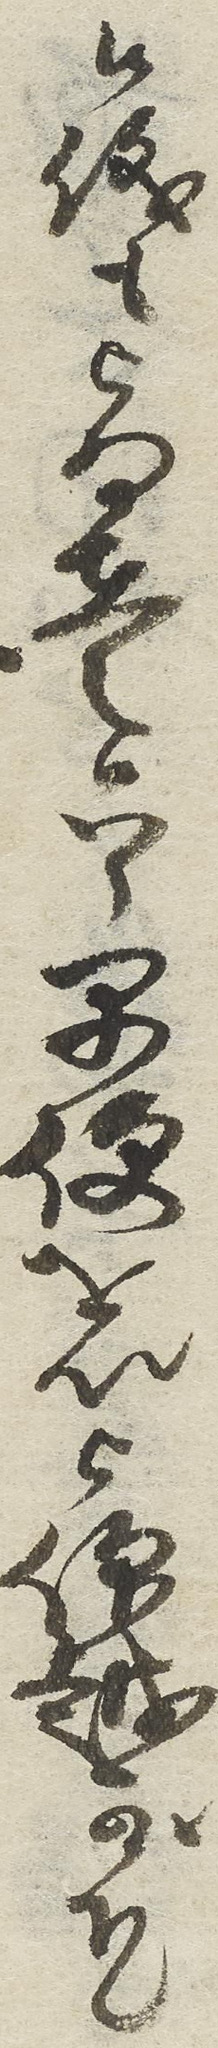候儀も被為在之候ハゝ早便を以被仰越可下候
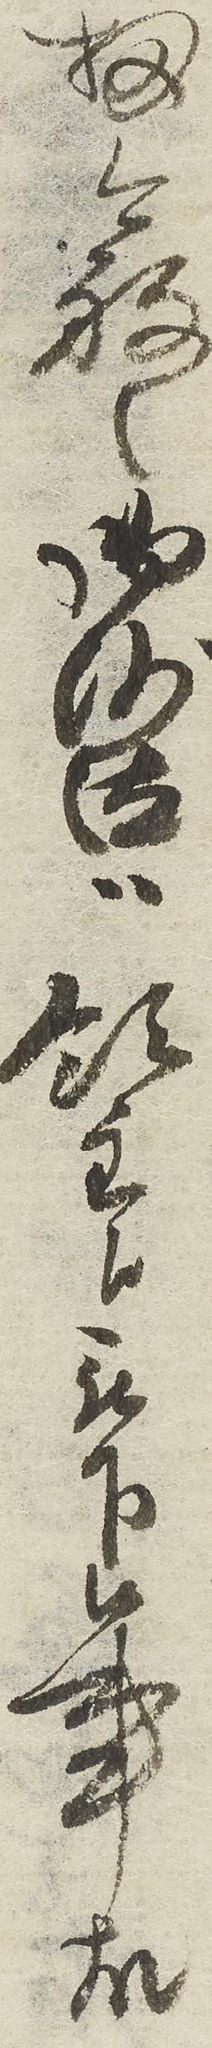扨今般之御沙汰ハ領主江被下候事故
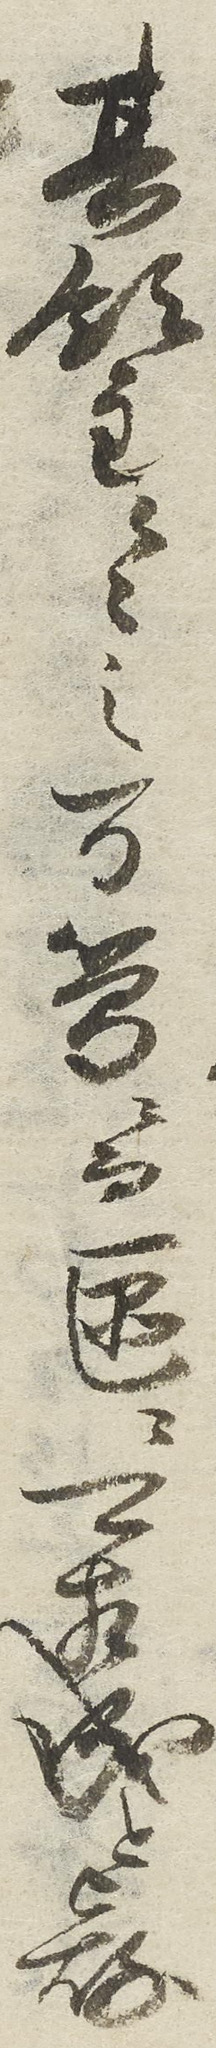其領主々々之了簡二而区二可相成と被存
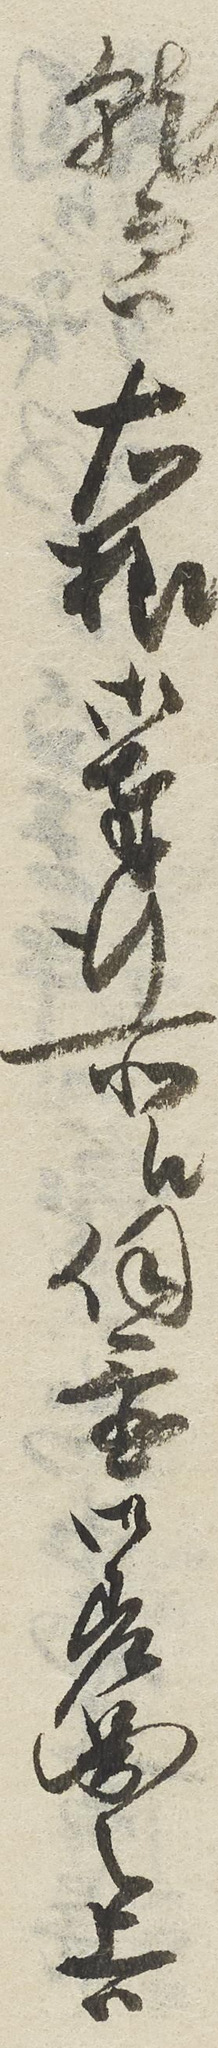就而ハ右様御奉行所江伺置御差図之上ハ
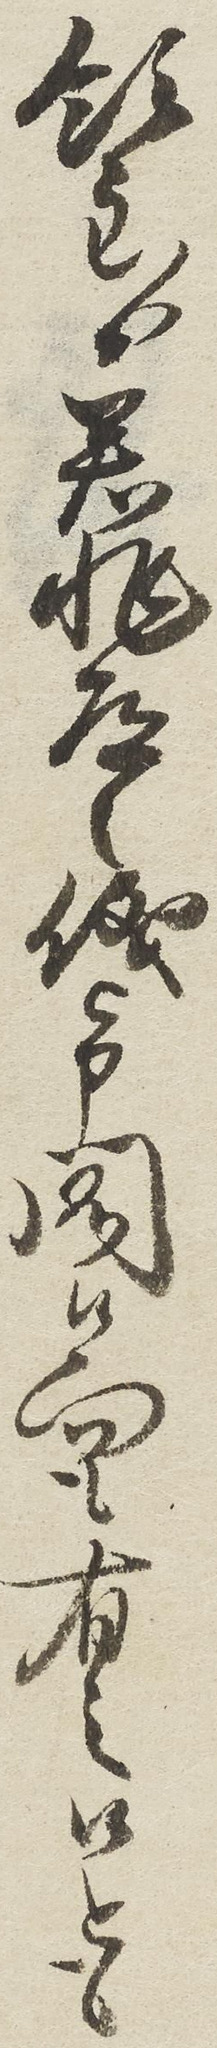領主ゟ若非道之儀被申聞候向も有之候とも
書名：[梵鐘差出一件]
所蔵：東京大学地震研究所図書室 Earthquake Research Institute Library, The University of Tokyo, JAPAN
